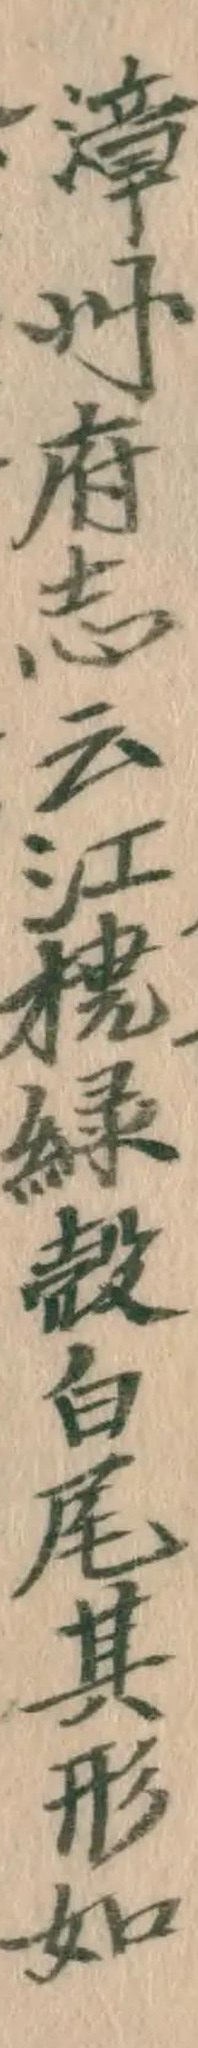漳州府志云江橈緑殻白尾其形如
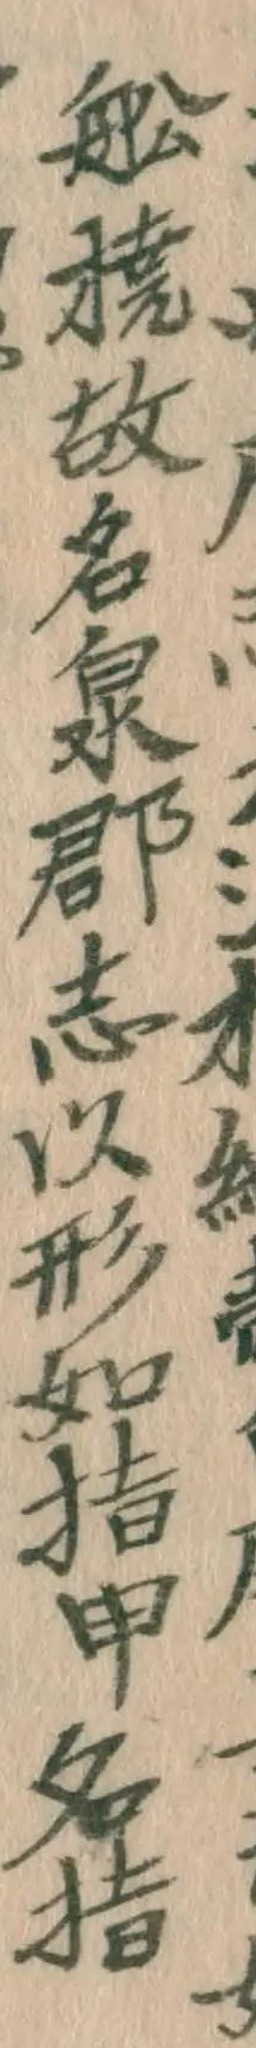舩橈故名泉郡志以形如指甲名指
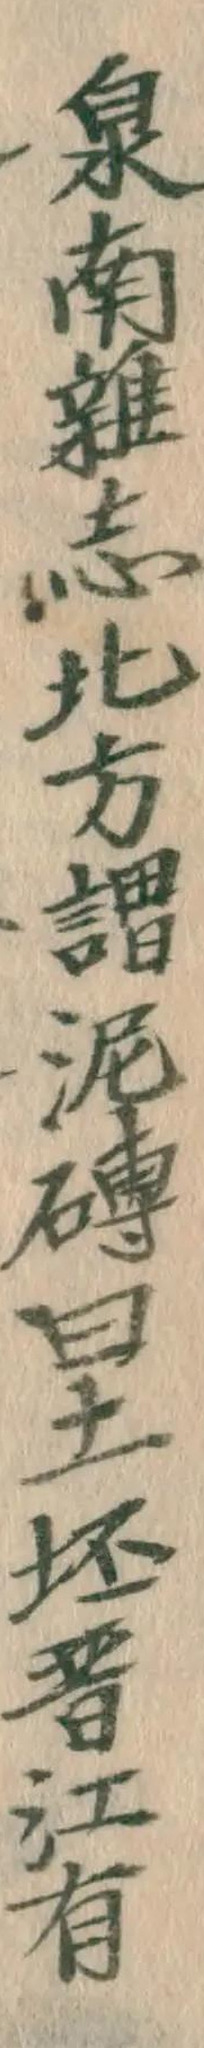泉南雜志北方謂泥磚曰土坯晋江有
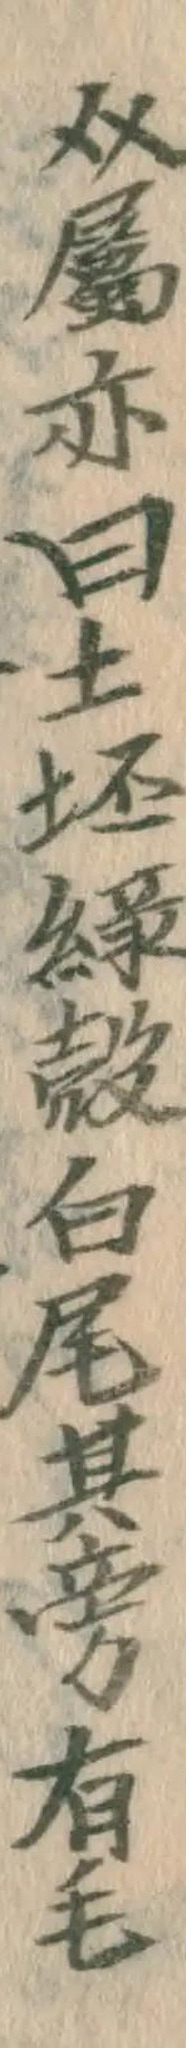介屬亦曰土坯緑殻白尾其旁有毛
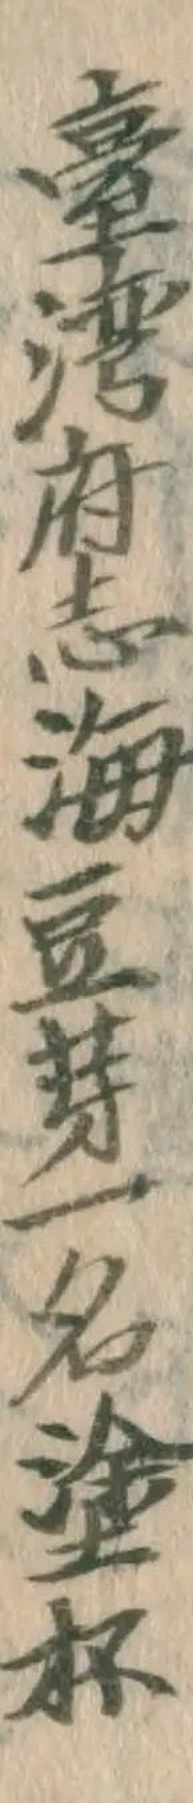臺湾府志海豆芽一名塗杯
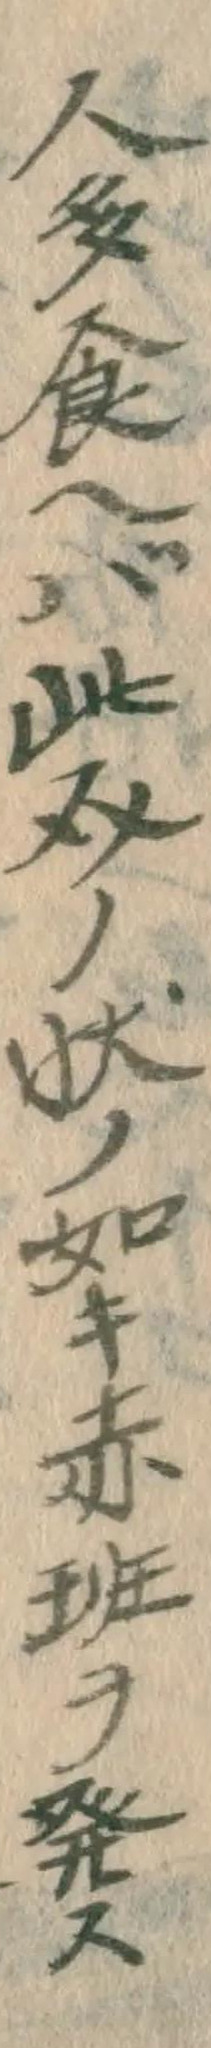人多食ヘバ此介ノ状ノ如キ赤班ヲ発ス
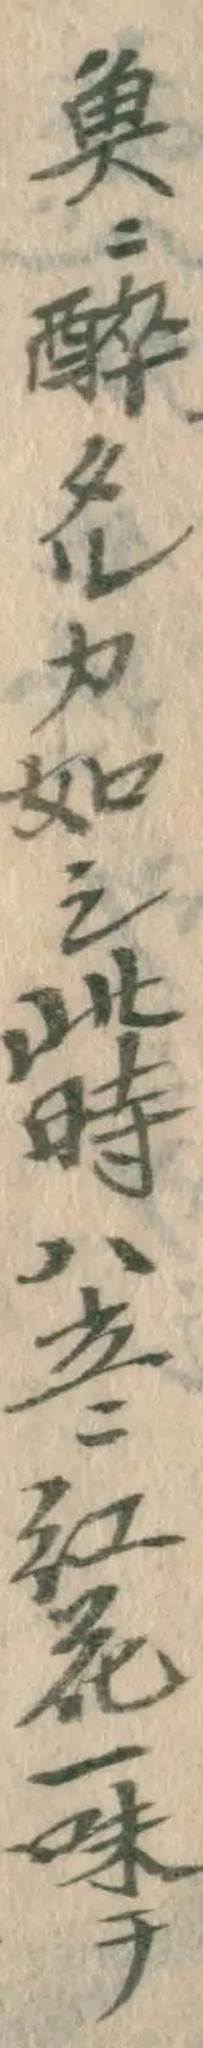魚ニ醉タルカ如シ此時ハ立ニ紅花一味ヲ
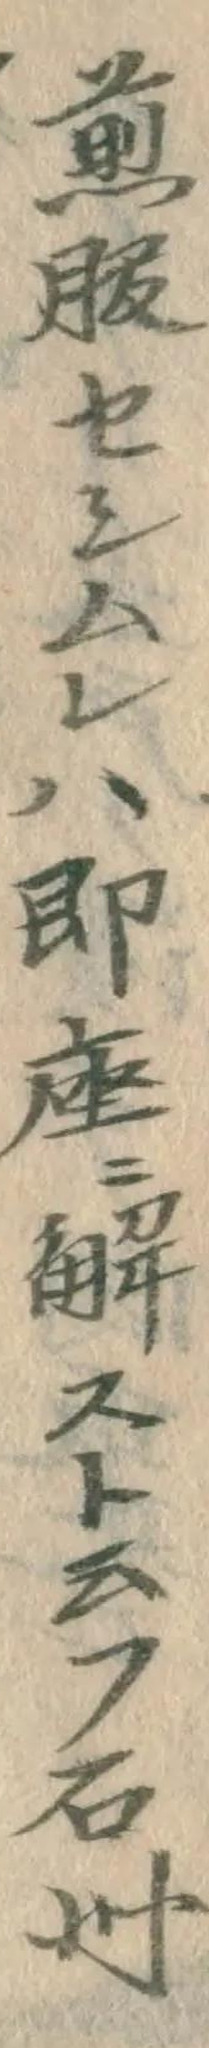煎服セシムレハ即座ニ解スト云フ石州
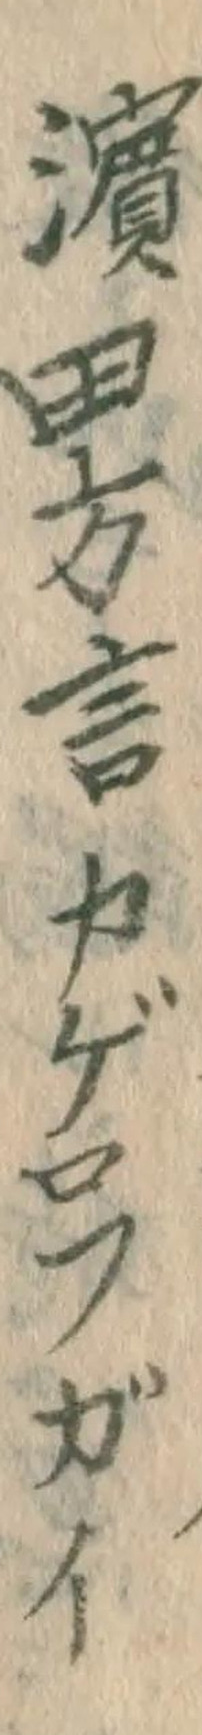濵田方言カゲロフガイ

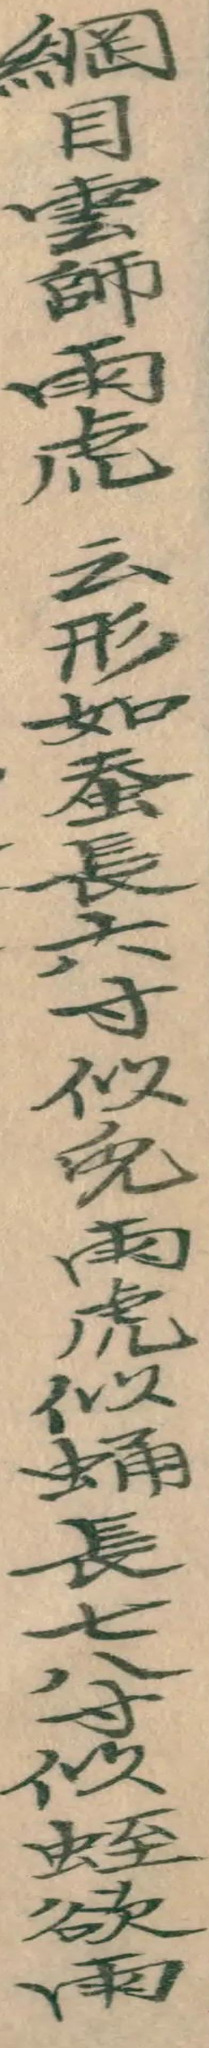綱目雲師雨虎云形如蚕長六寸似兎雨虎似蛹長七八寸似蛭欲雨
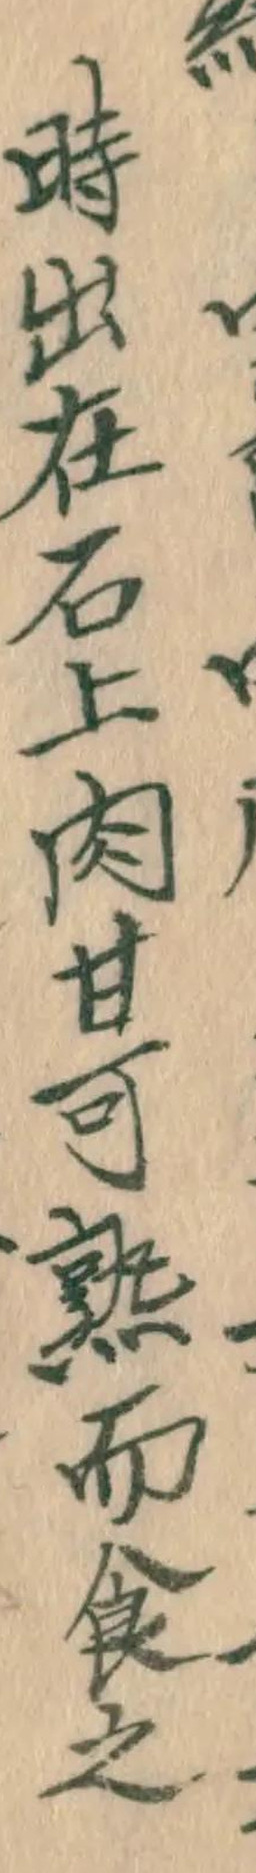時出在石上肉甘可熟而食之
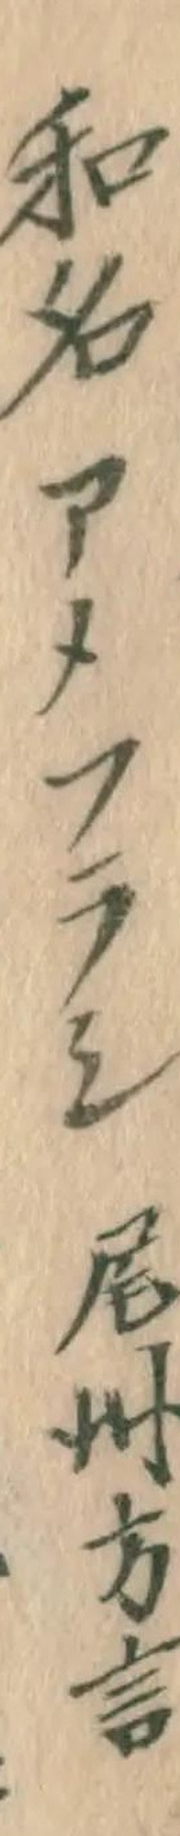和名アメフラシ尾州方言
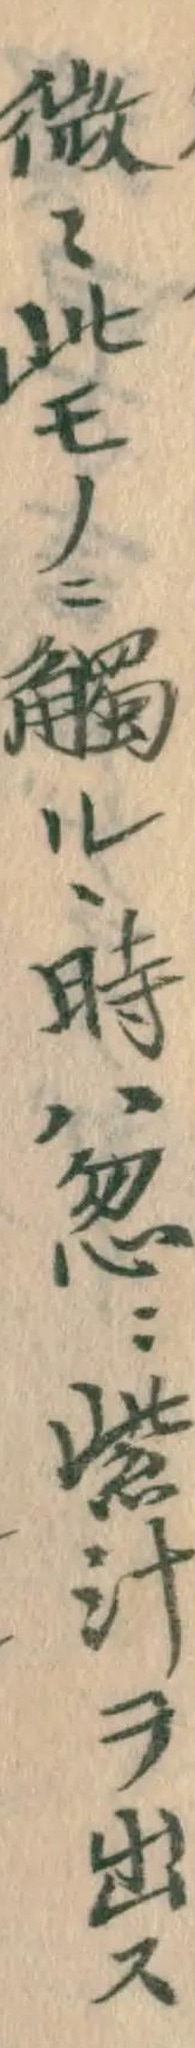微々此モノニ觸ルヽ時ハ忽ニ紫汁ヲ出ス
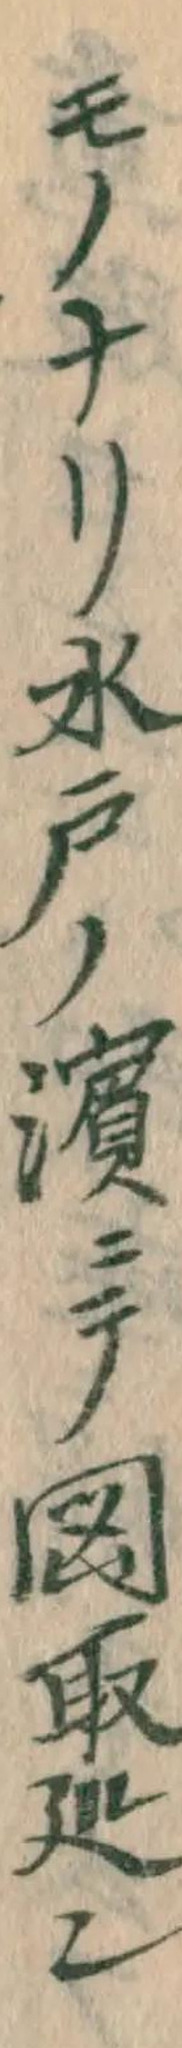モノナリ水戸ノ濵ニテ図取処也
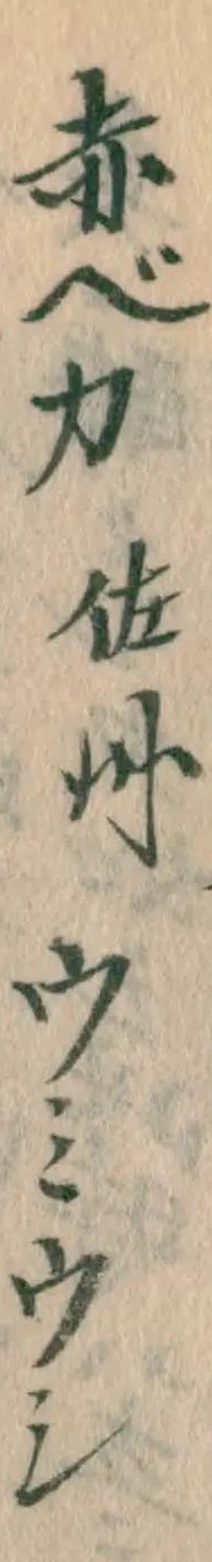赤ベカ佐州ウミウシ
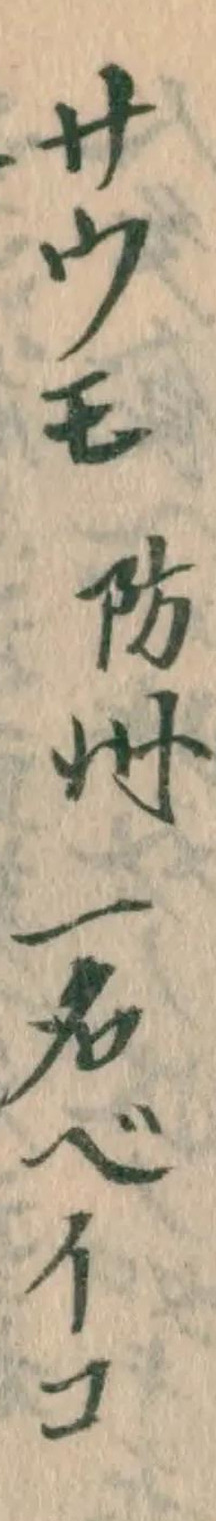サウモ防州一名ベイコ
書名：千蟲譜 3巻. [1]
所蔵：国立国会図書館 National Diet Library, JAPAN
